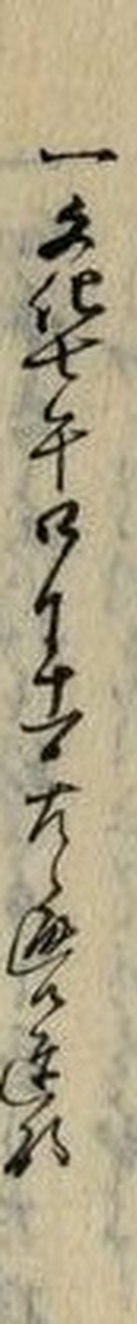一文化七午四月十一日左之通口達触
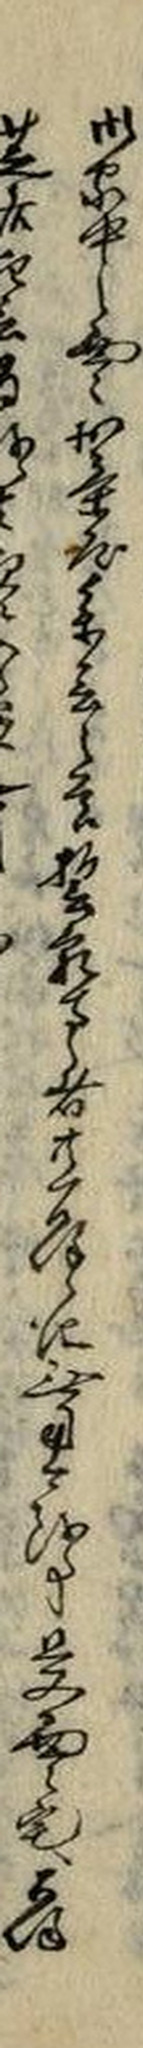御家中之面々於茶屋参会之節誓願寺之者共召呼候儀無用可致事且又面々宅へ召呼
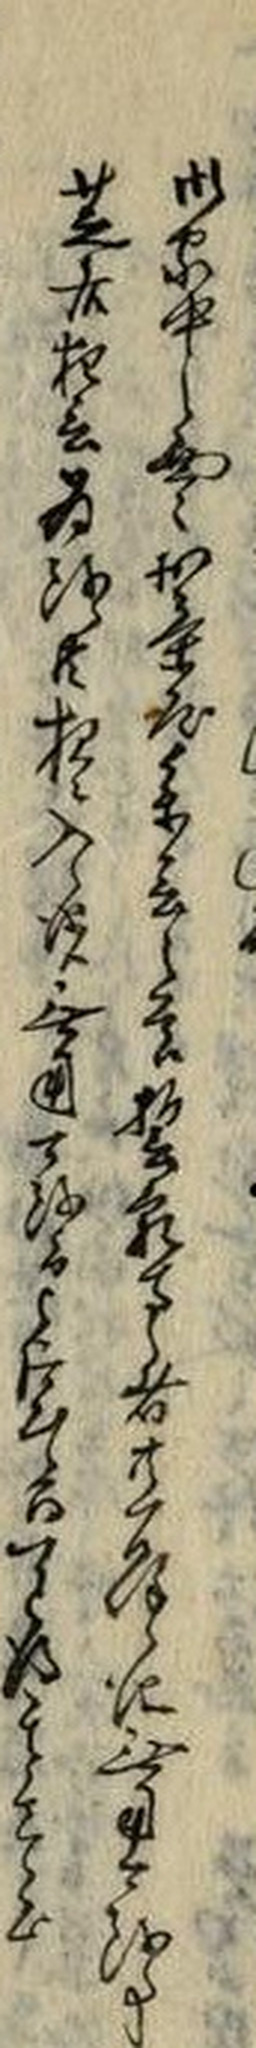芝居狂言為致候共夜に入候儀は無用可致旨被仰出候間可被得其意候以上
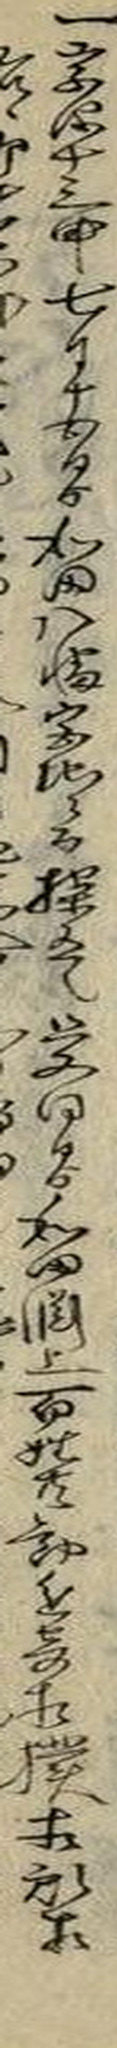一享保十三申七月十五日ゟ和田八幡宮地にて操有之且又同日ゟ和田淵上百姓共勧進寄相撲相願相
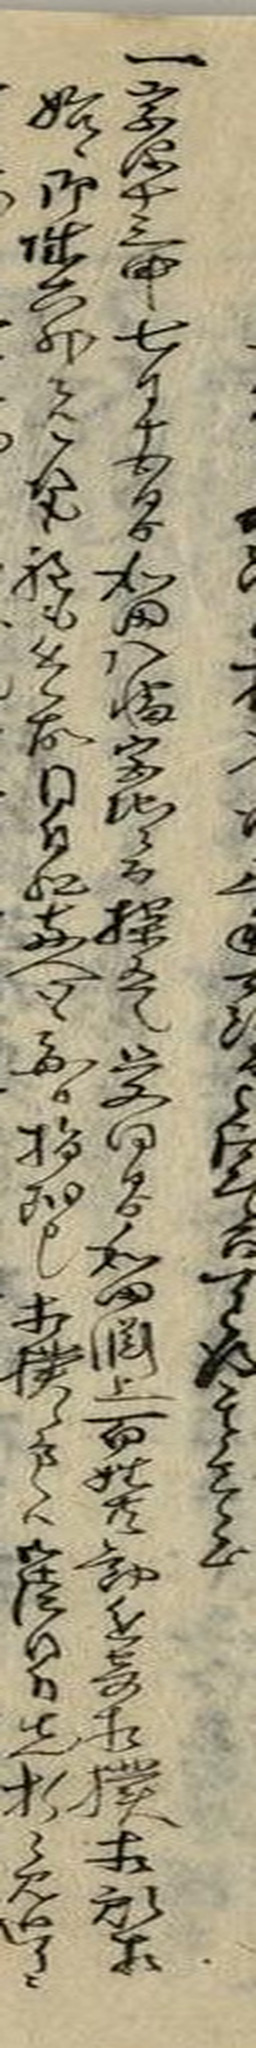始候御城下外には候得共程も近候故目付組両人ツヽ毎日指越申候相撲之方へは御徒目付先折之見廻りに
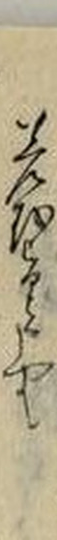差越旨被申聞候
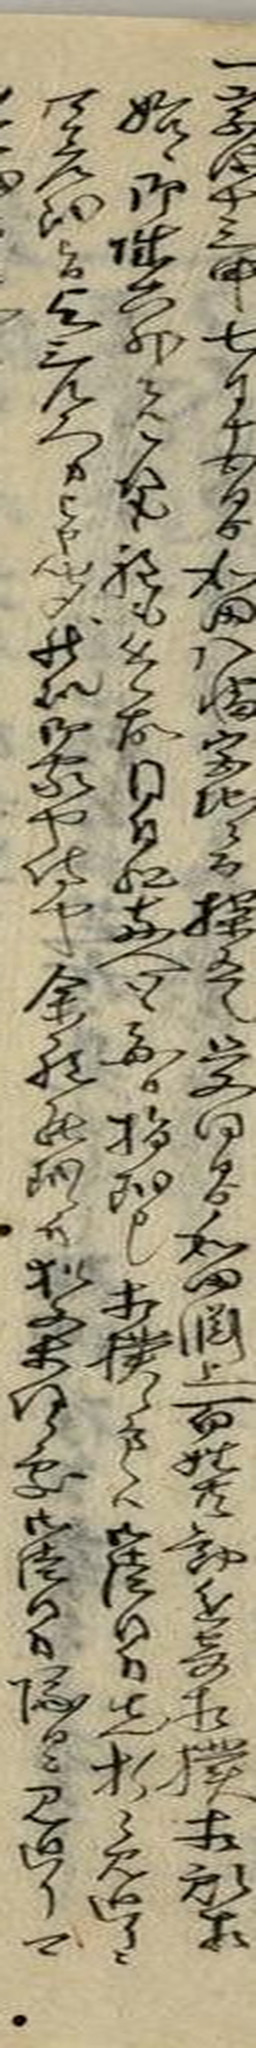可差越旨与三左衛門方被申聞然処御家中侍中余程罷越候に付猶又相伺候処御徒目付隔日に見廻り可
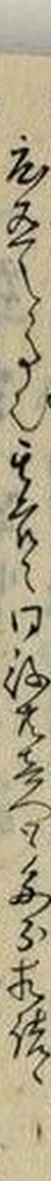度有之事也其節に同役共壱人ツヽ多分相詰候
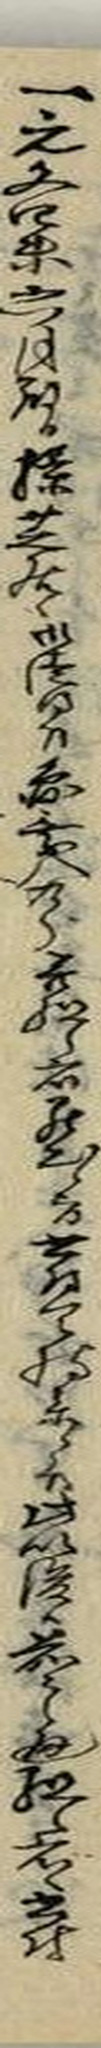一元文四未六月朔日操芝居へ御徒目付円乗八九郎并組之者罷出候旨書付可持参候に付此以後は前々之通組之者へ書付
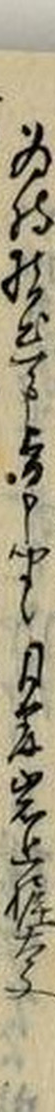為持指出可申旨申聞候月番岩上梶大夫
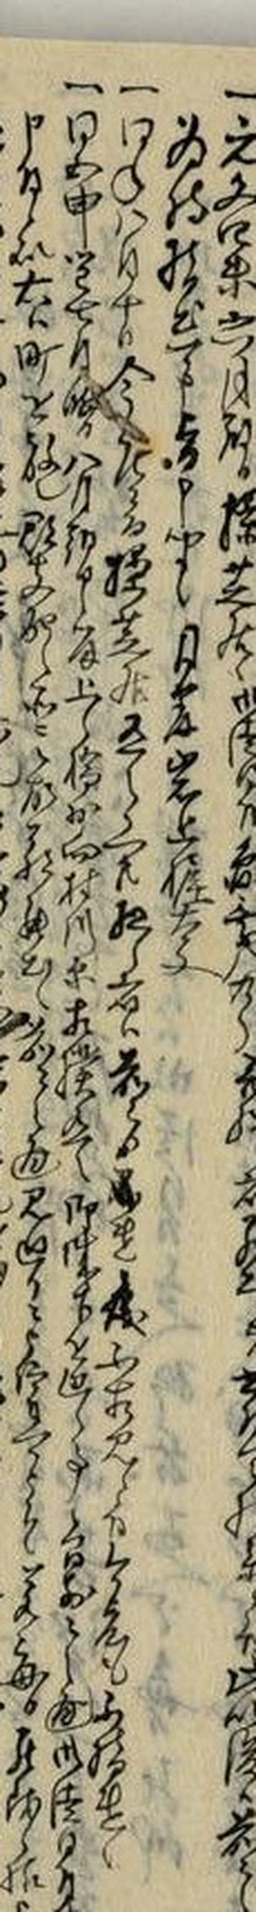一同年八月十日今庄にて操芝居有之候へ共組之者は前々ゟ不遣候儀不相見候に付今度も不指遣候
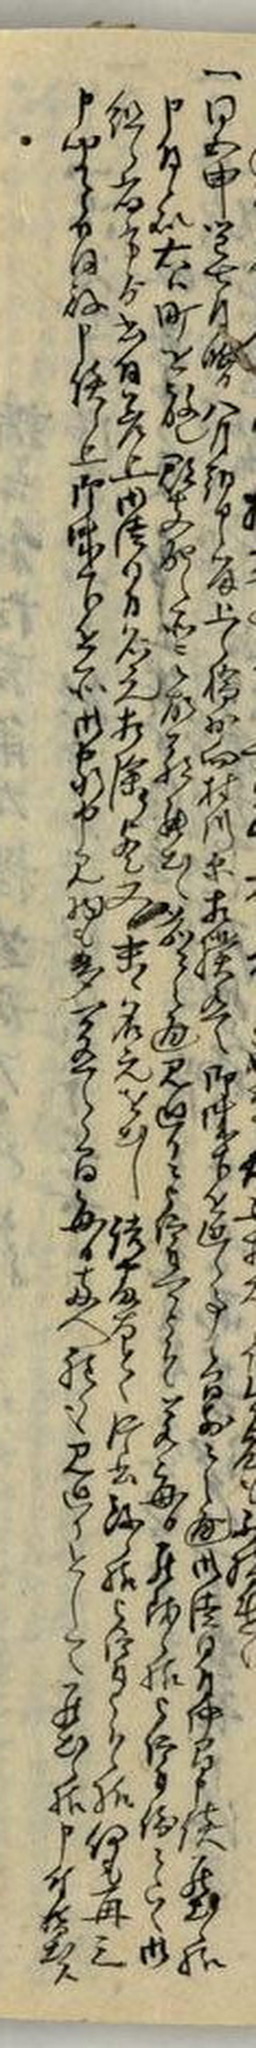組之者方ゟ書付差上御徒目付名元相除候歟又は末へ名元を出し詰番なとゝ片書致候様被仰付被下候様何も再三
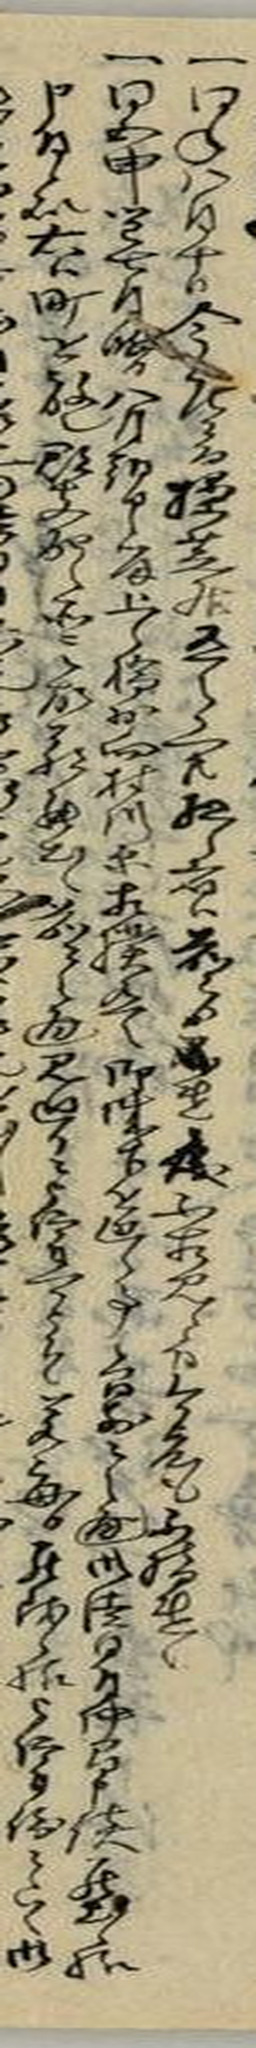申付候処右は町を放レ郡支配之所に候故難罷出候前々之通見廻りと被仰付可被下候若毎日罷越候様被仰付儀に候はゝ御
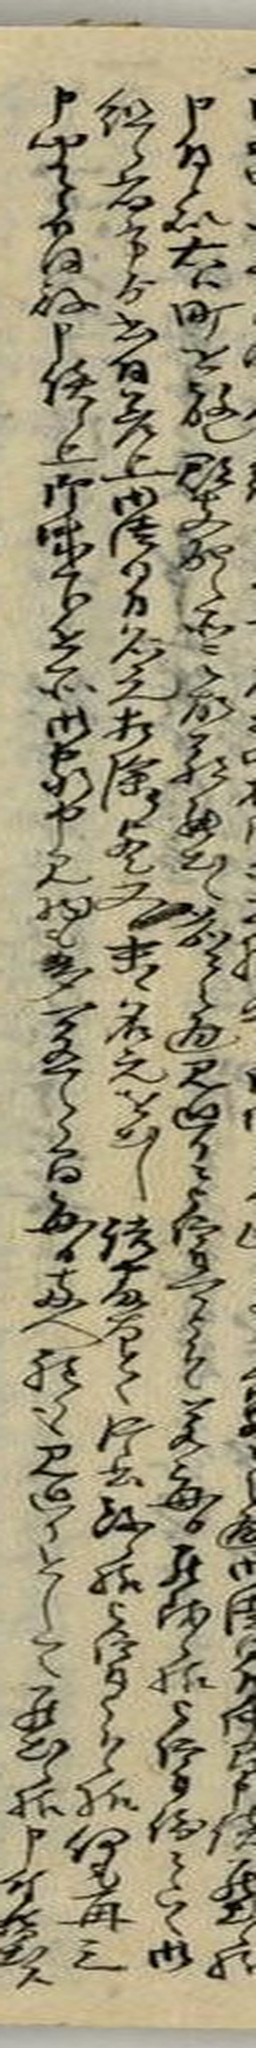申聞候に付同役申談候上御城下近所御家中見物も多可有之候間毎日両人程ツヽ見廻りとして罷出候様申付指出ス
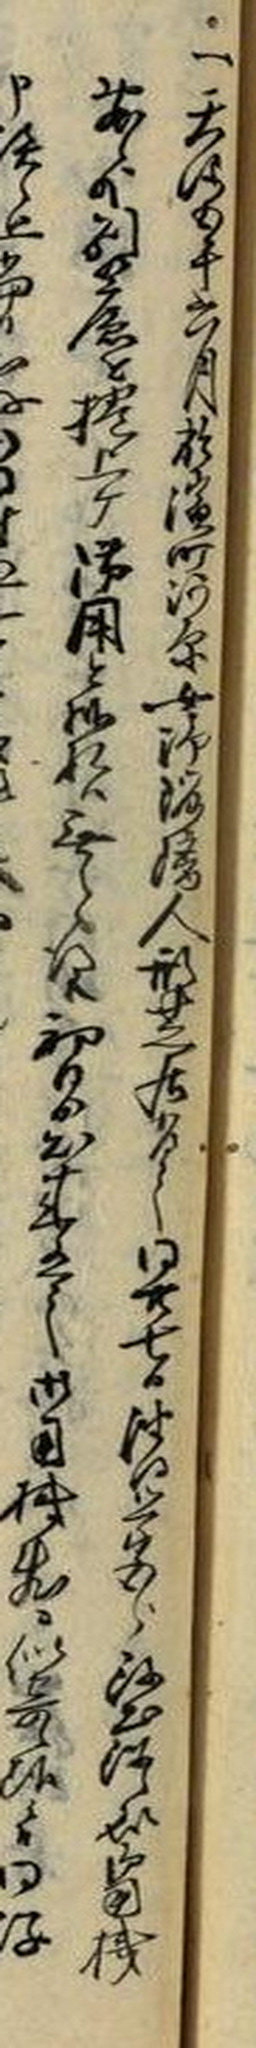敷之外列簾を捲上ケ御用と掛札は無之候得共初日ゟ出来有之御用桟敷に似寄候趣に付同役
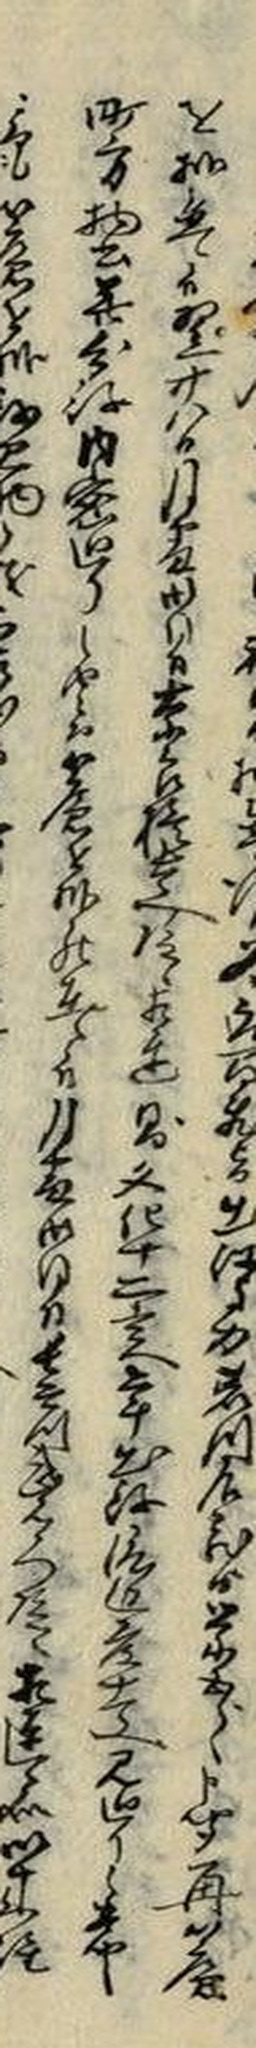町方物書并分役内密廻り之由にて簾を掛罷在候に付月番御目付長谷川武右衛門殿へ相達候処以来誰
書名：御城下諸事之部
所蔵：福井県文書館 Fukui Prefectural Archives
